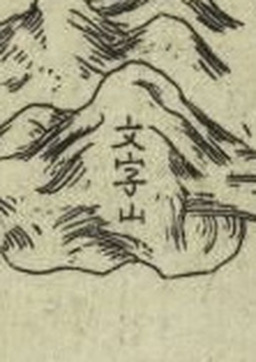文字山
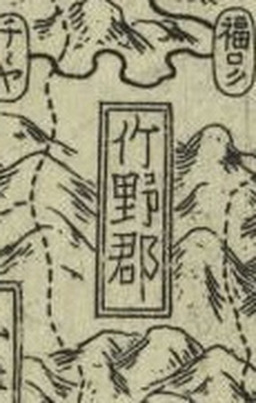竹野郡
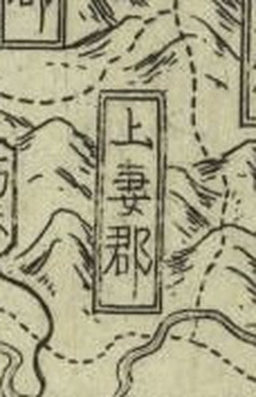上妻郡
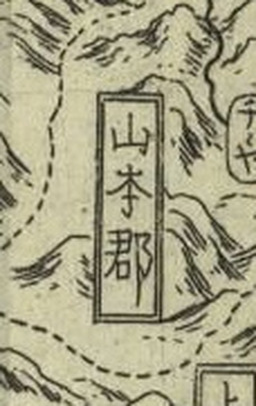山本郡
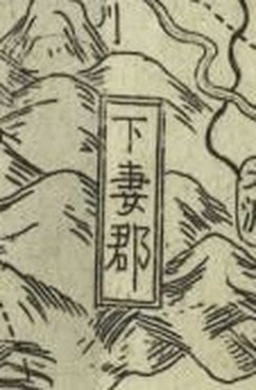下妻郡
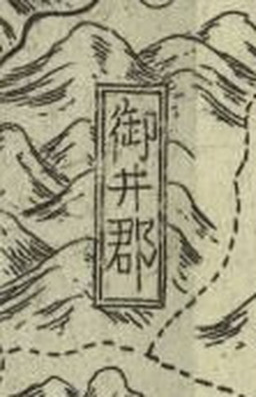御井郡
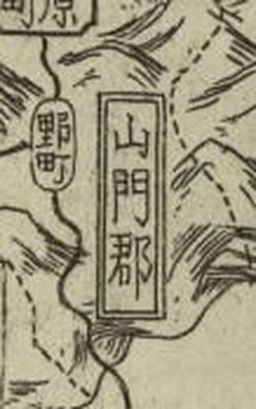山門郡
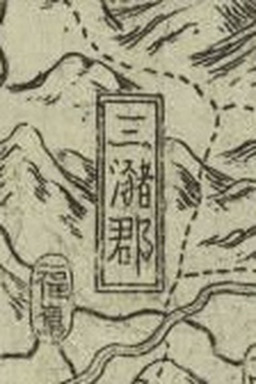三潴郡
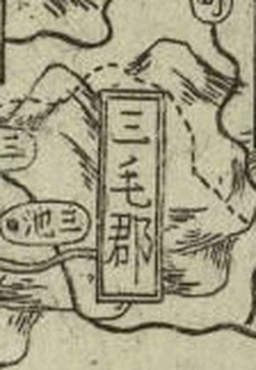三毛郡

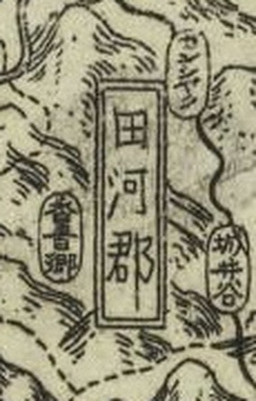田河郡
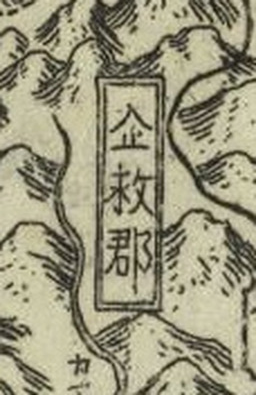企救郡
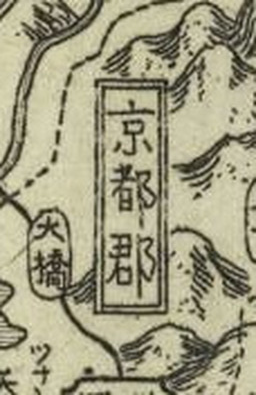京都郡
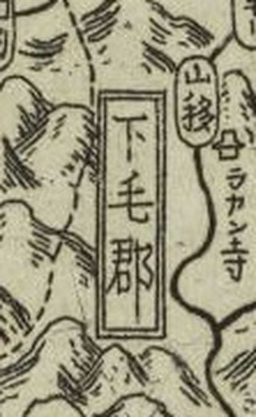下毛郡
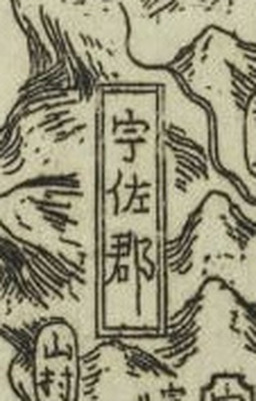宇佐郡

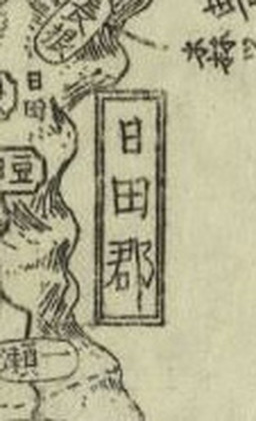日田郡
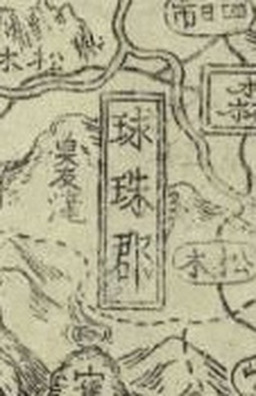球珠郡
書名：大日本国細図 西国之部 下
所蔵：University of the Ryukyus Library
